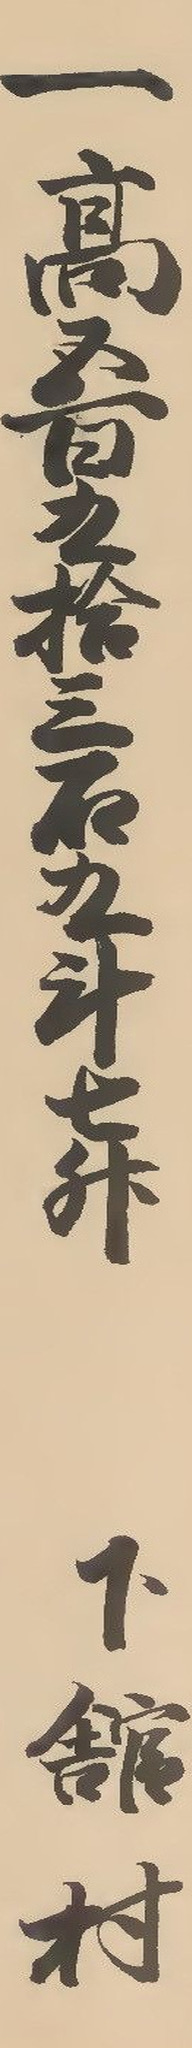一高五百九拾三石九斗七升下館村
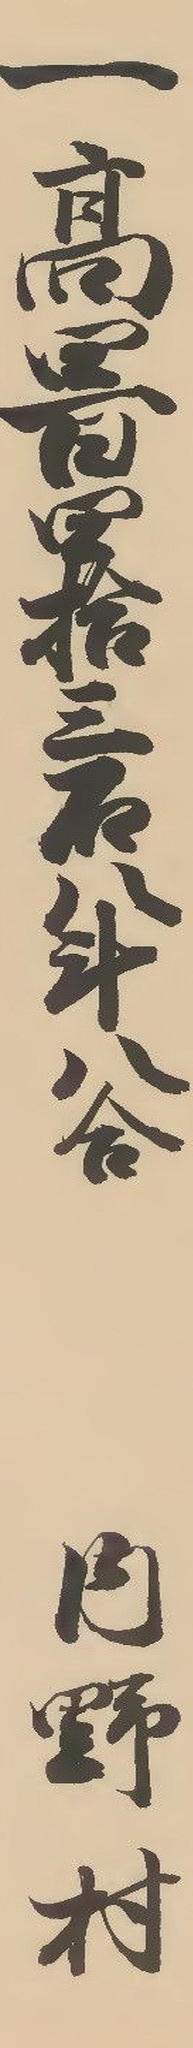一高四百四拾三石八斗八合内野村
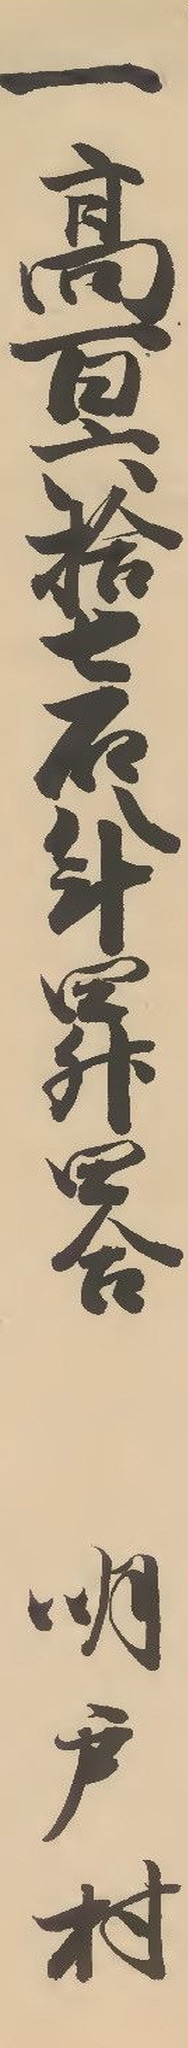一高百六拾七石斗八四升四合明戸村
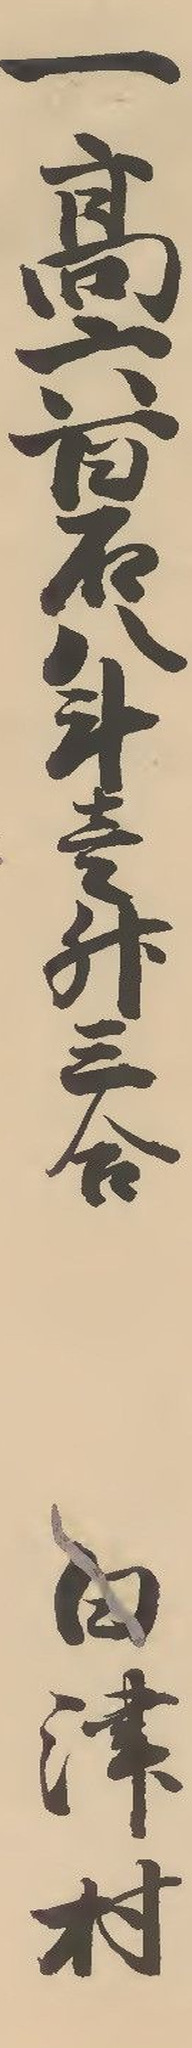一高六百石八斗壱升三合白津村

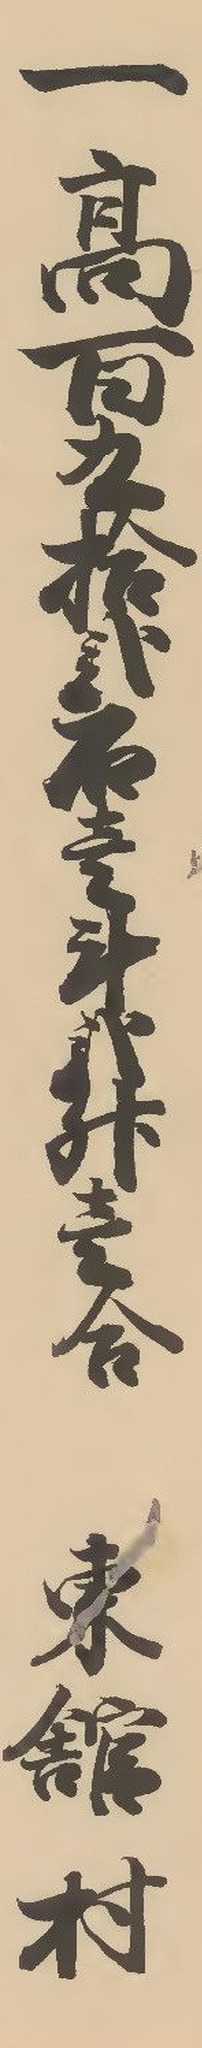一高百九拾弐石壱斗弐升壱合東館村
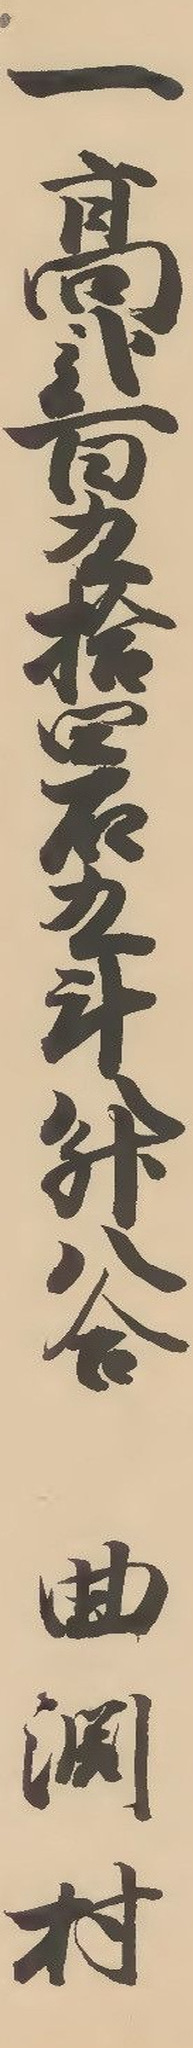一高弐百九拾四石九斗八升八合曲淵村
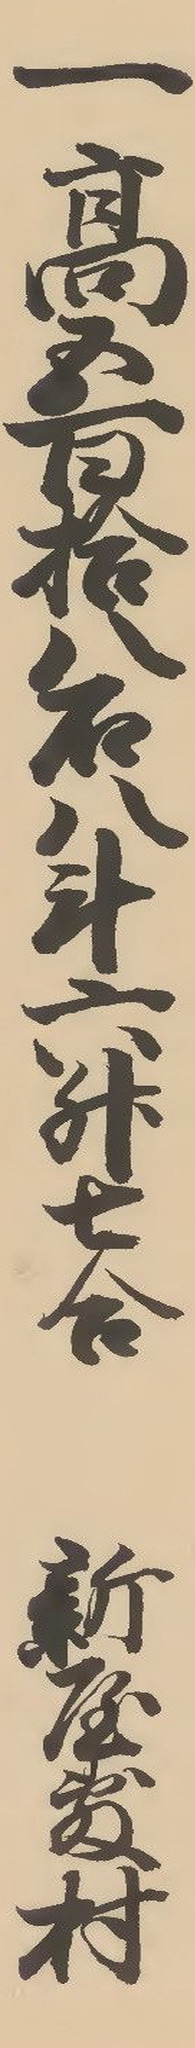一高五百拾八石八斗六升七合新屋敷村
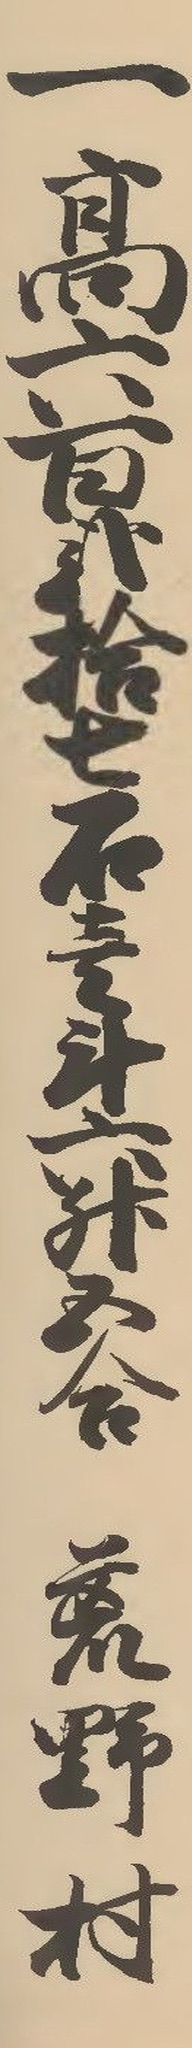一高六百弐拾七石壱斗六升五合荒野村
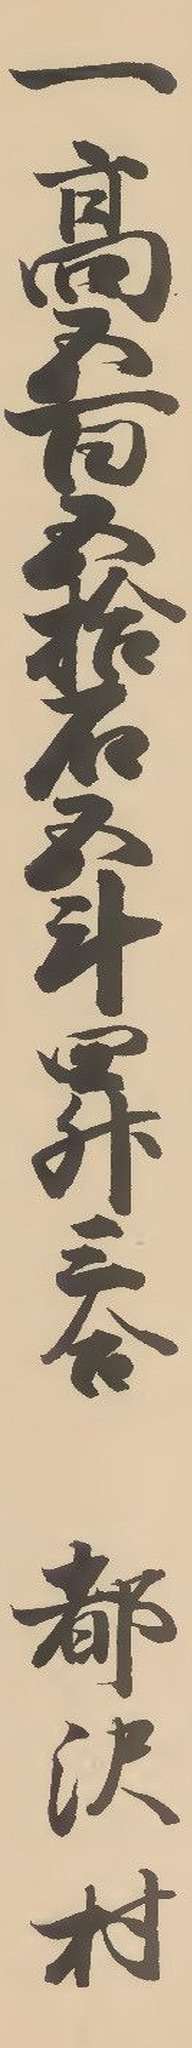一高五百五拾石五斗四升三合都沢村
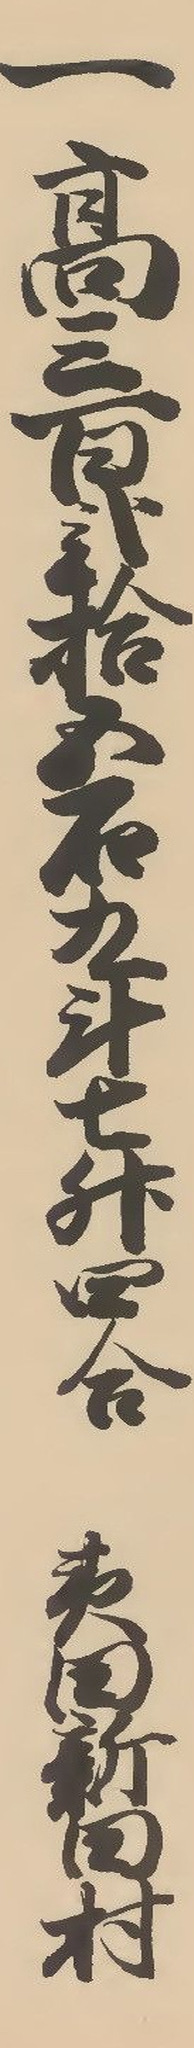一高三百弐拾五石九斗七升四合夷田新田村
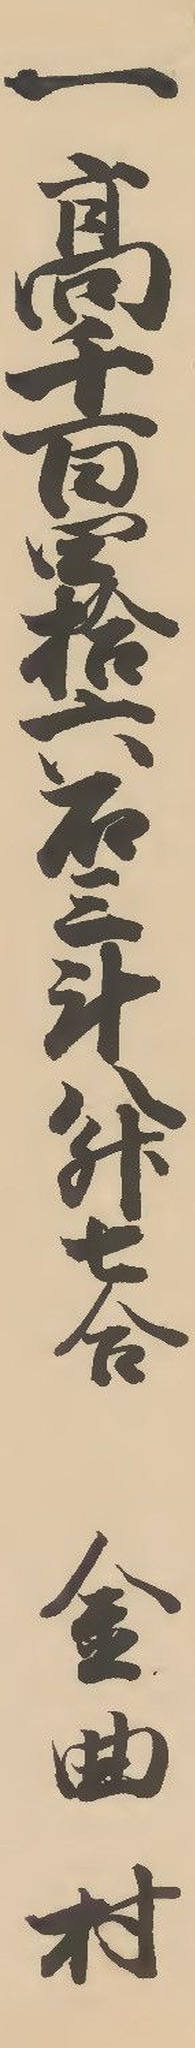一高千百四拾六石三斗八升七合金曲村
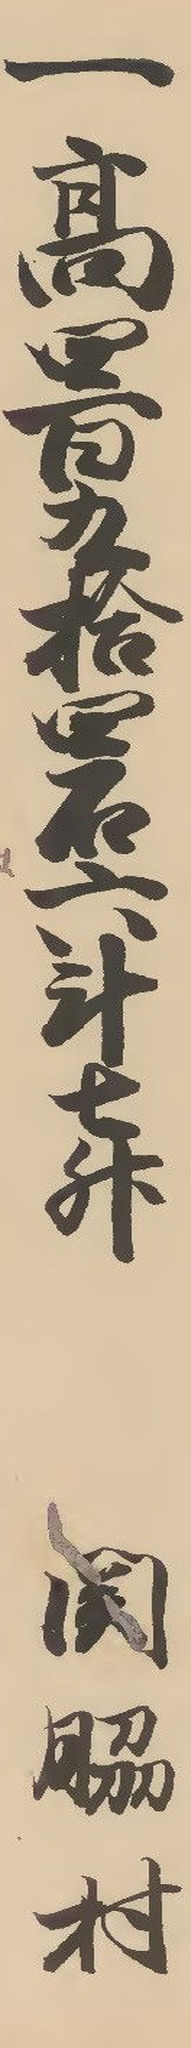一高四百九拾四石六斗七升関脇村

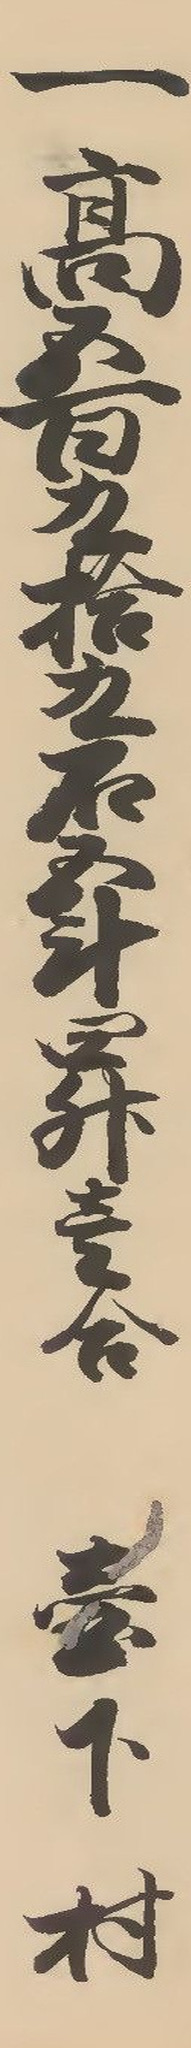一高五百九拾九石五斗四升壱合台下村
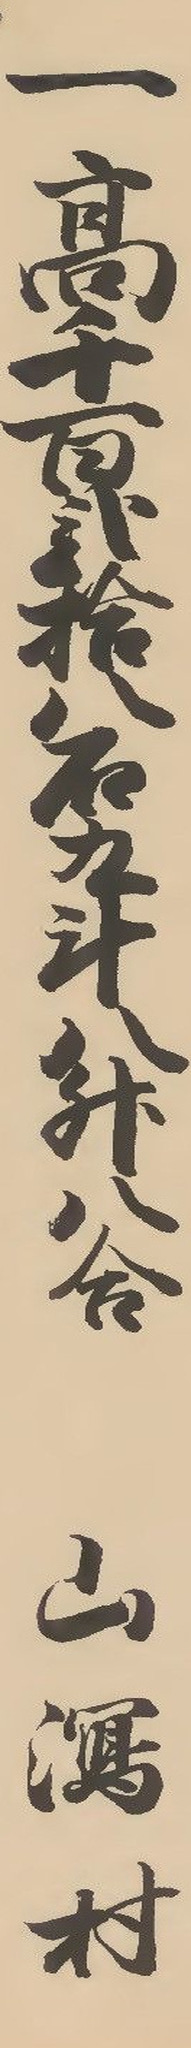一高千百弐拾八石九斗八升八合山潟村
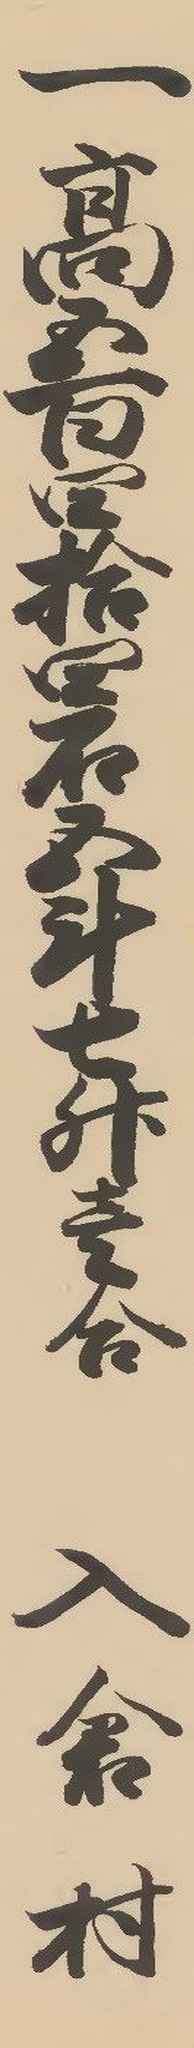一高五百四拾四石五斗七升壱合入倉村
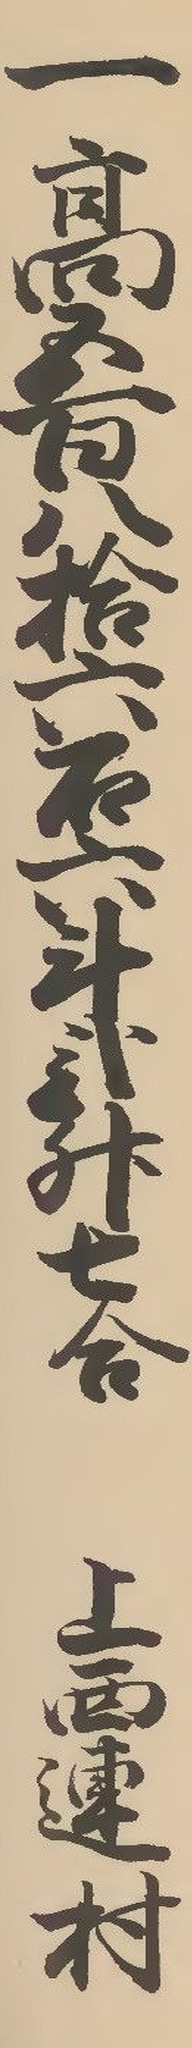一高五百八拾六石六斗弐升七合上西連村
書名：陸奥国郷帳　１
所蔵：国立公文書館 National Archives of Japan
